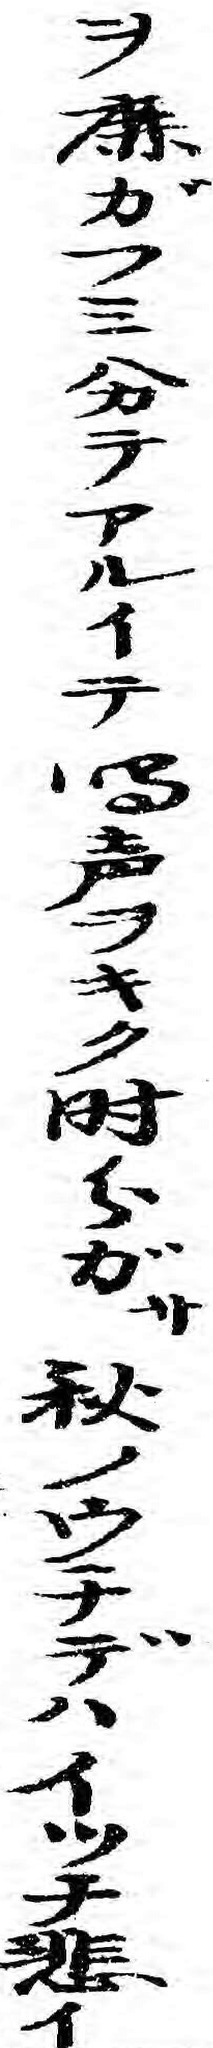ヲ鹿ガフミ分テアルイテ鳴声ヲキク時分ガ秋ノウチデハイツチ悲イ
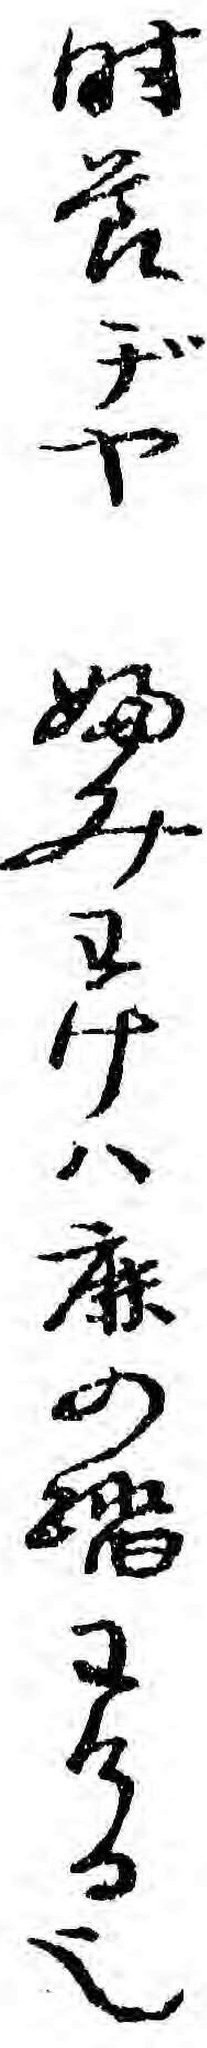時節ヂヤふみわけは鹿の踏わける也
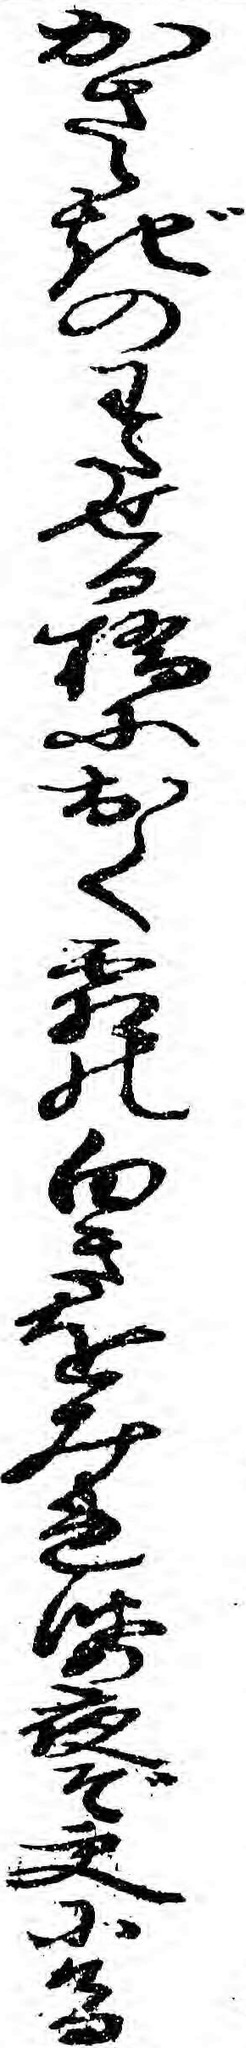かさゝぎのわたせる橋におく霜の白きをみれは夜ぞ更にける
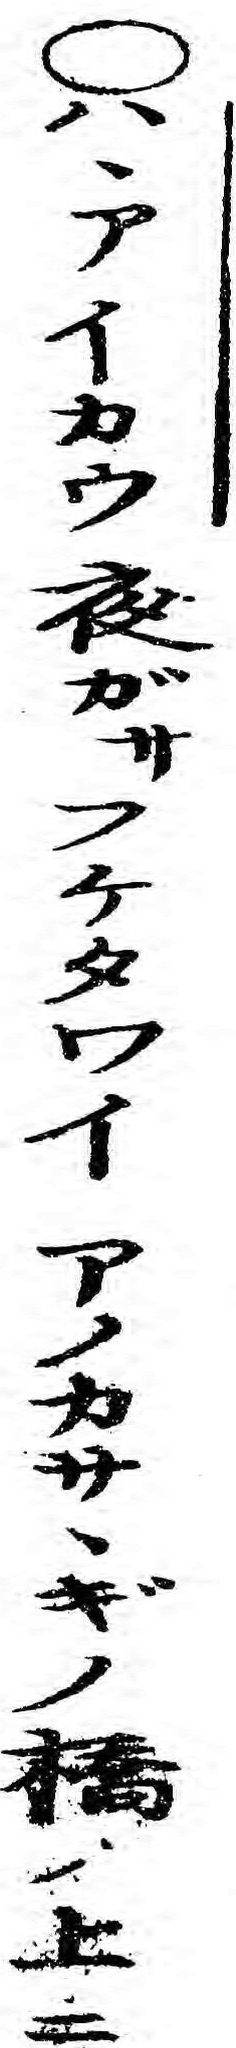○ハヽアイカウ夜ガフケタワイアノカサヽギノ橋ノ上ニ
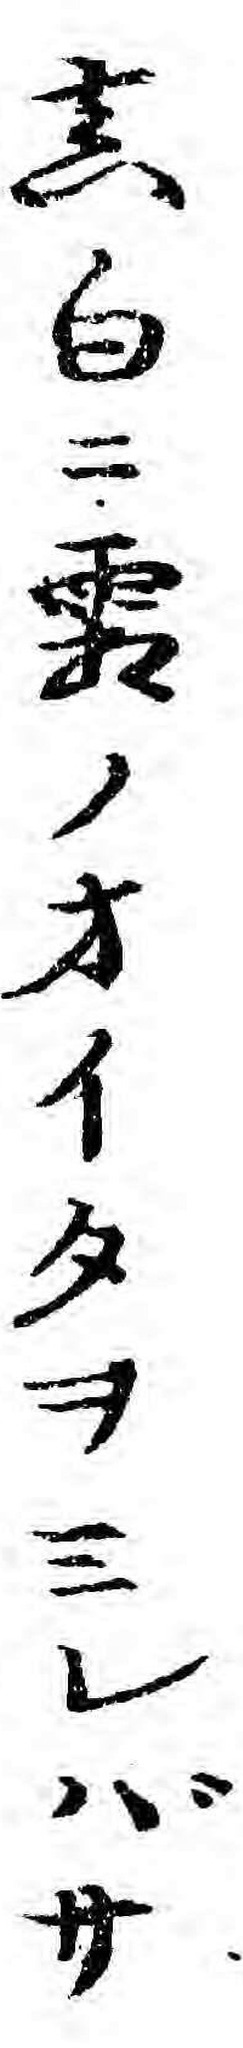真白ニ霜ノオイタヲミレバサ
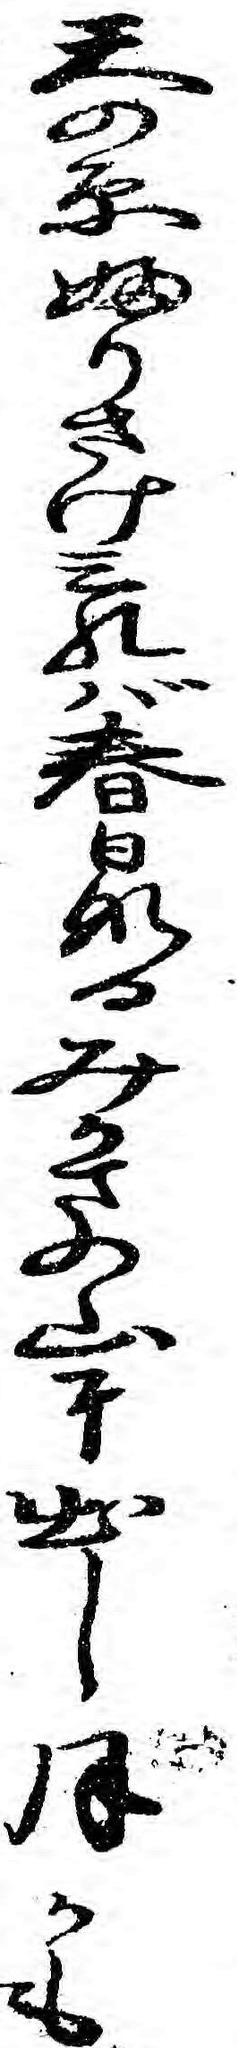天の原ふりさけみれば春日なるみかさの山に出し月かも
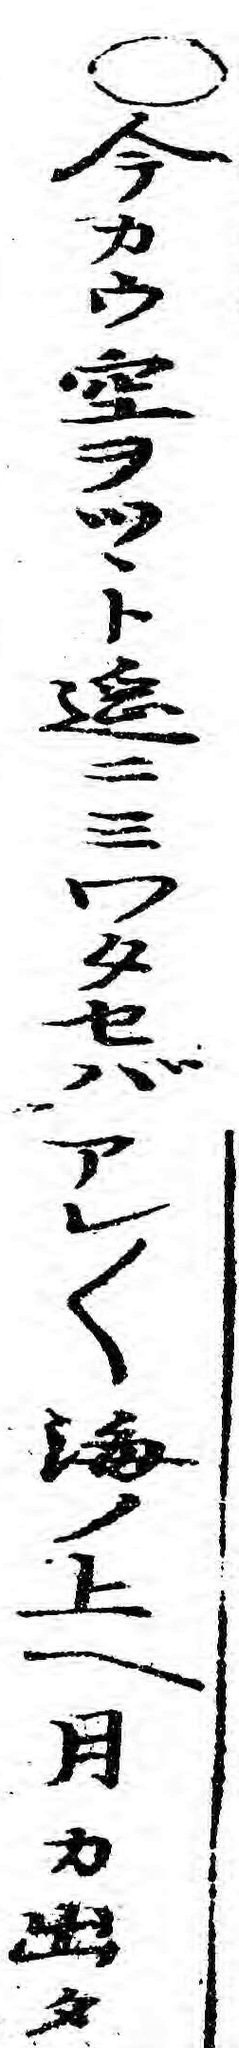○今カウ空ヲツヽト遥ニミワタセバアレ〳〵海ノ上ヘ月カ出タ

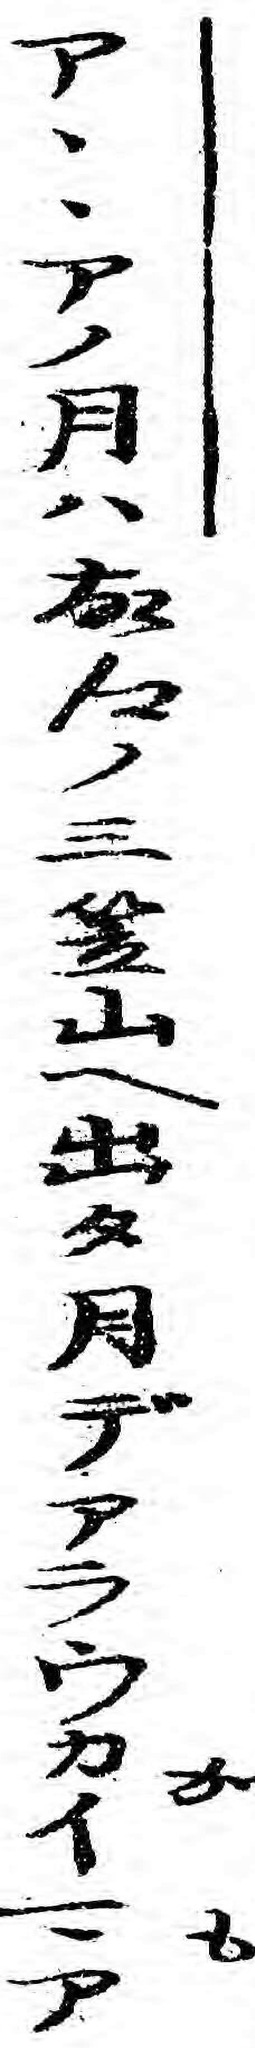アヽヽアノ月ハ故郷ノ三笠山ヘ出タ月デアラウカイマア
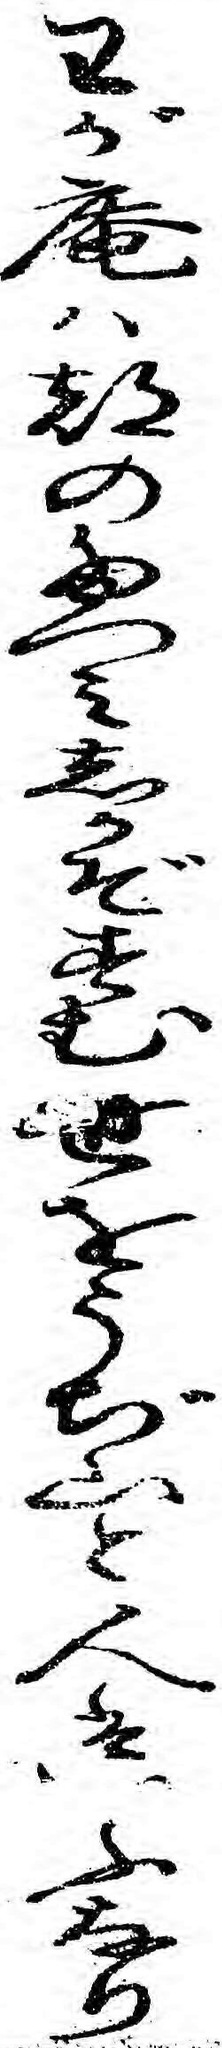わが庵は都のたつみしかぞすむ世をうぢ山と人はいふなり
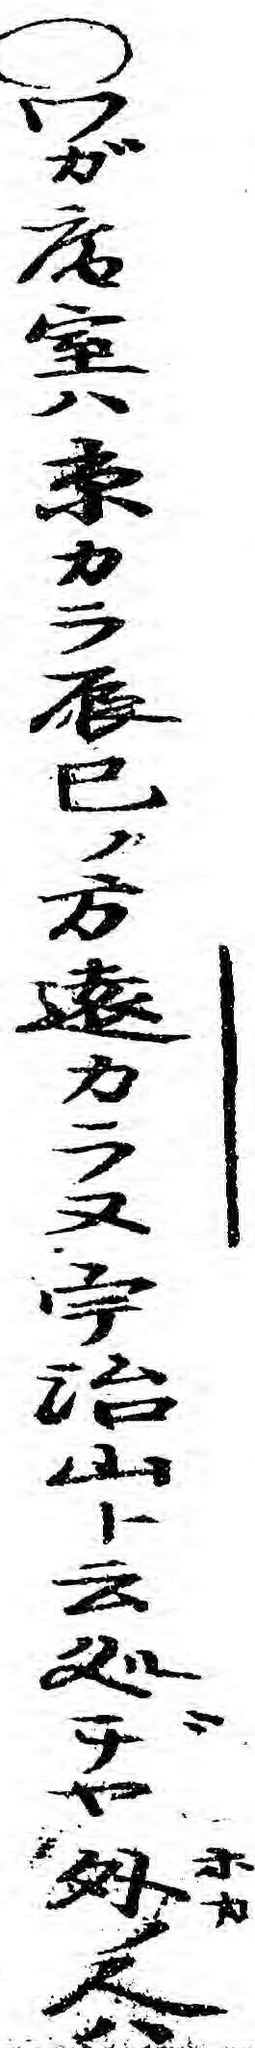○ワガ廬室ハ京カラ辰巳ノ方遠カラヌ宇治山と云処ヂヤ外ノ人ハ
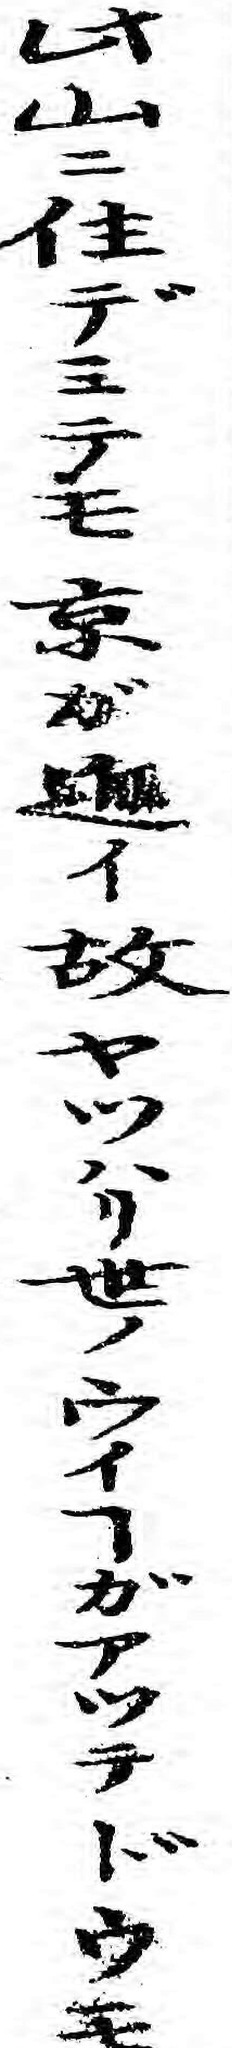此山ニ住デミテモ京ガ近イ故ヤツハリ世ノウイコトガアツテドウモ
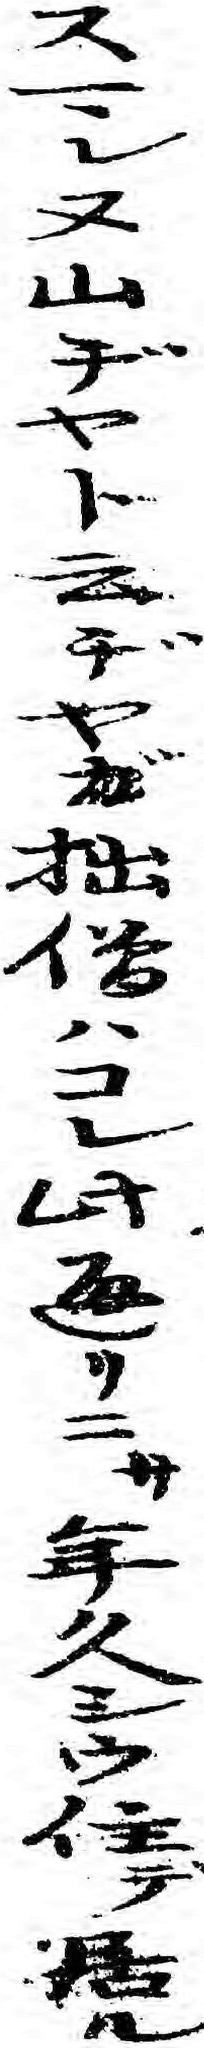スマレヌ山ヂヤト云ヂヤガ拙僧ハコレ此通リニ年久シウ住デ居ル
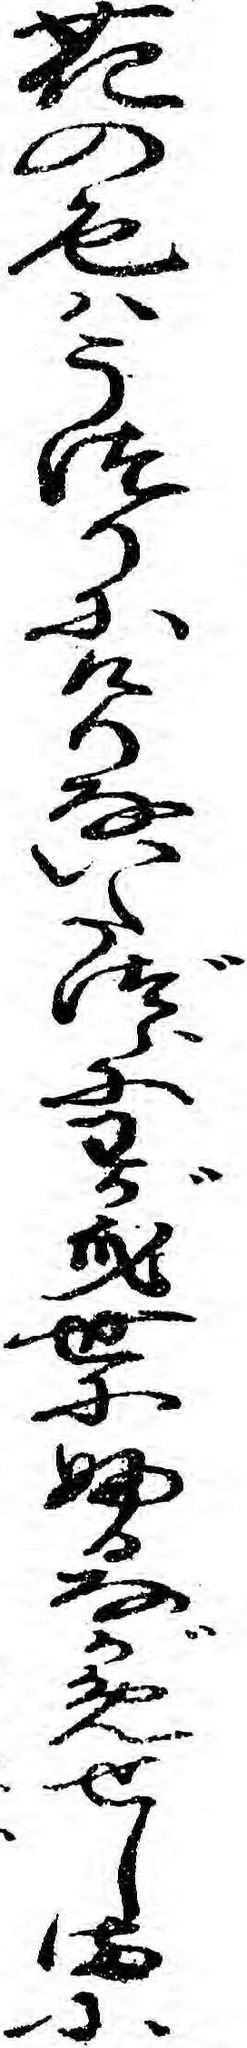花の色はうつりにけりないたづらにわが身世にふるながめせしまに
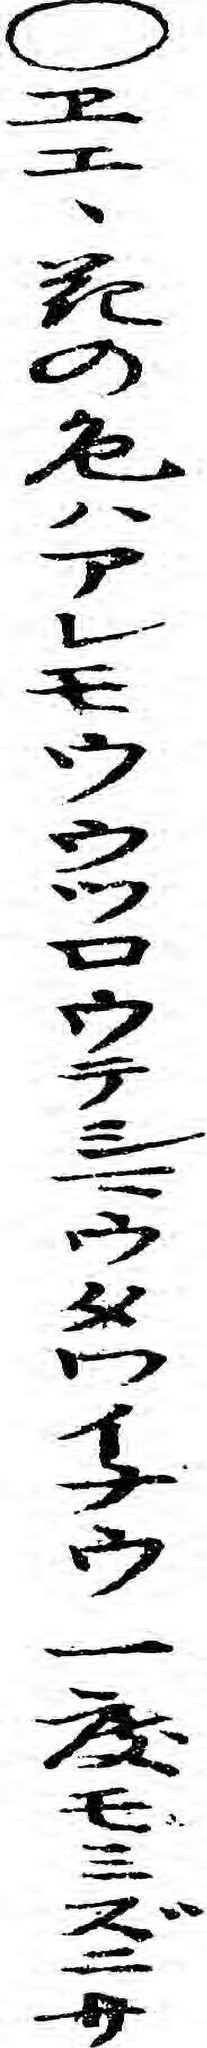○ヱエヽ花の色ハアレモウウツロウテシマウタワイナウ一度モミズニサ
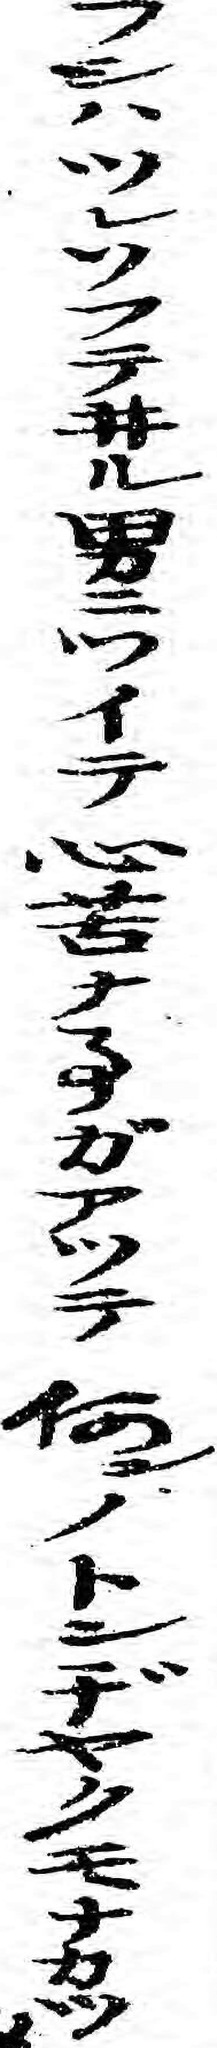フシハツレソフテヰル男ニツイテ心苦ナ事ガアツテ何ノトンヂヤクモナカツタ
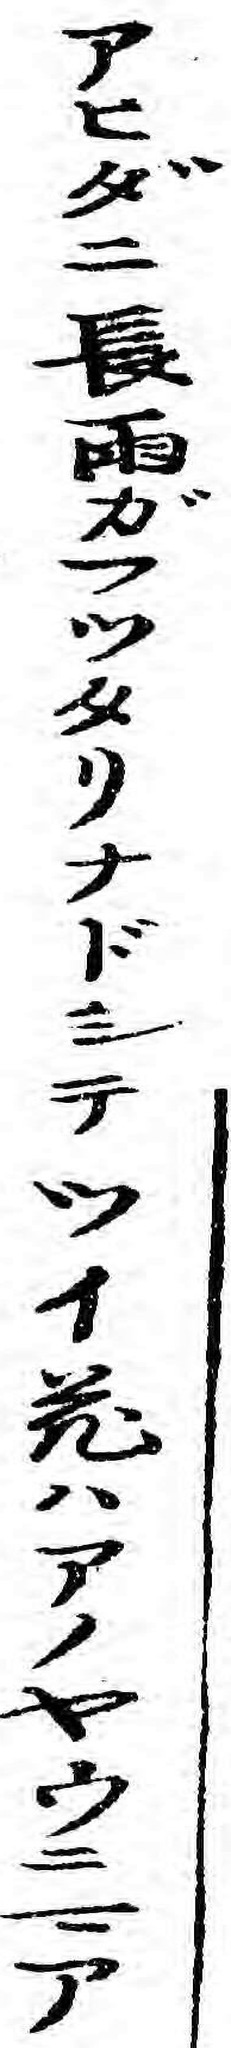アヒダニ長雨ガフツタリナドシテツイ花ハアノヤウニマア
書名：百人一首／小倉の山ふみ
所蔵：国文学研究資料館
